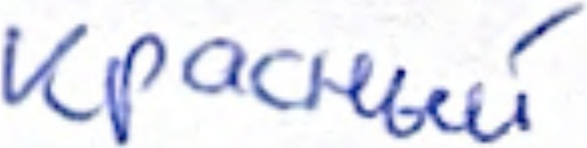красный
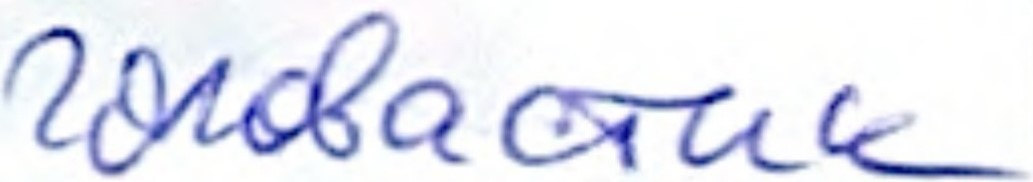головастик
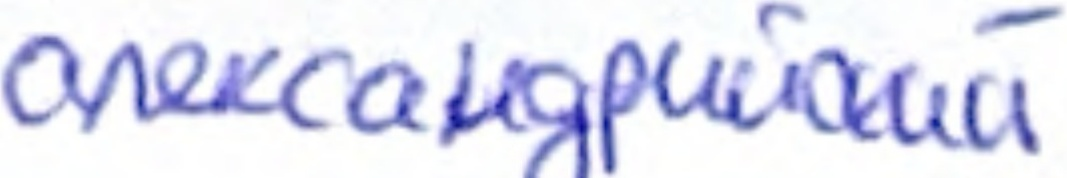александрийский
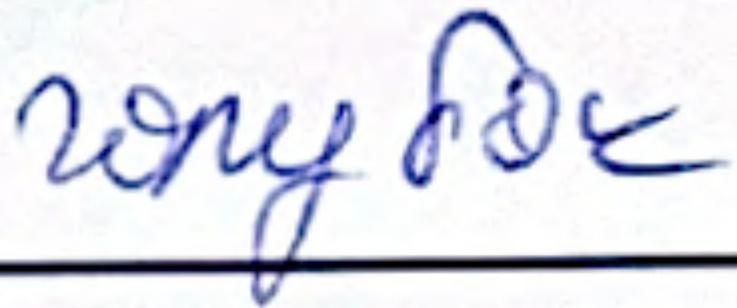голубок
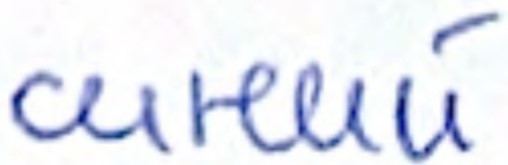синий
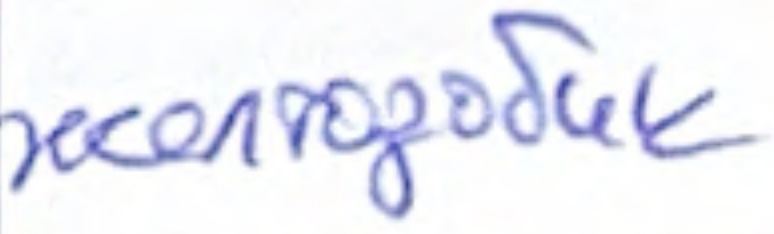желтозобик
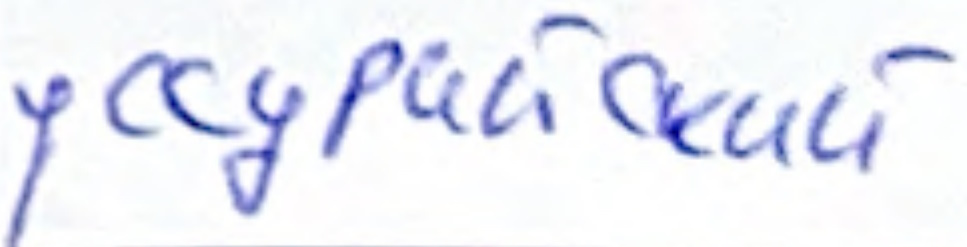уссурийский
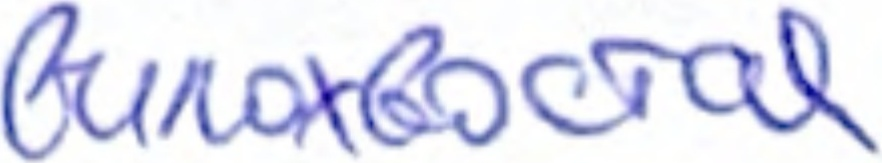вилохвостая
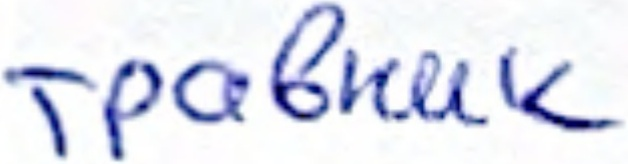травник
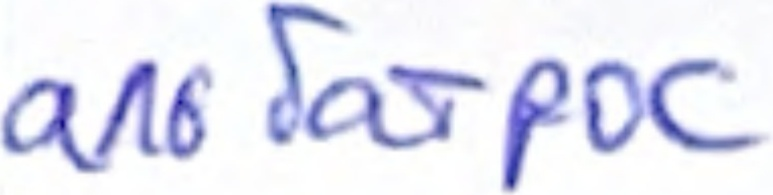альбатрос
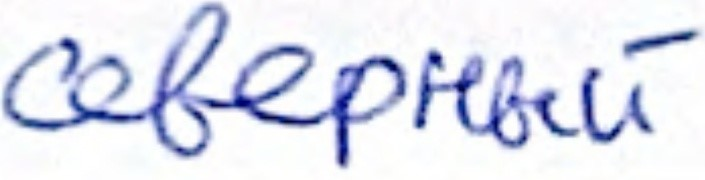северный
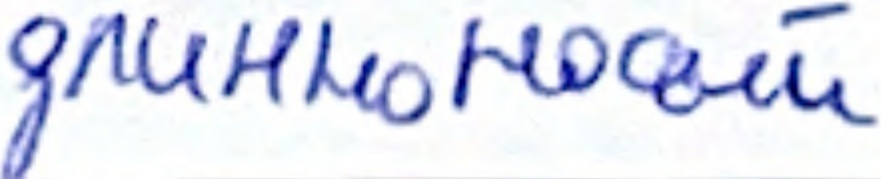длинноносый
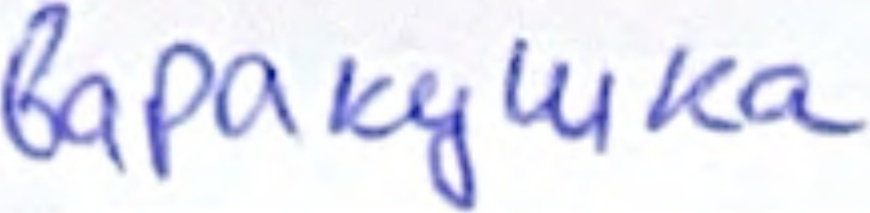варакушка
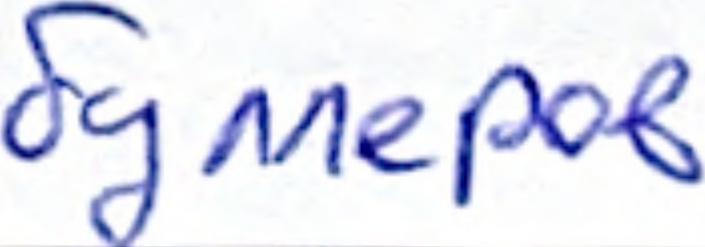буллеров
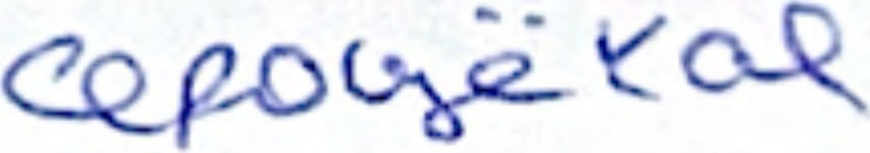сероцёкая
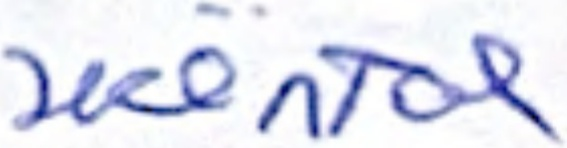жёлтоя
